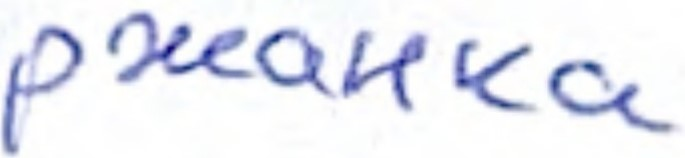ржанка
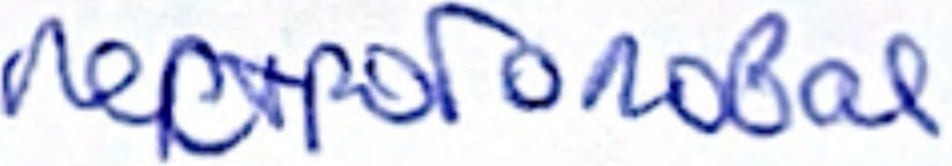пестроголовая
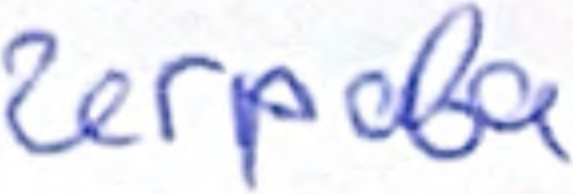чегрова
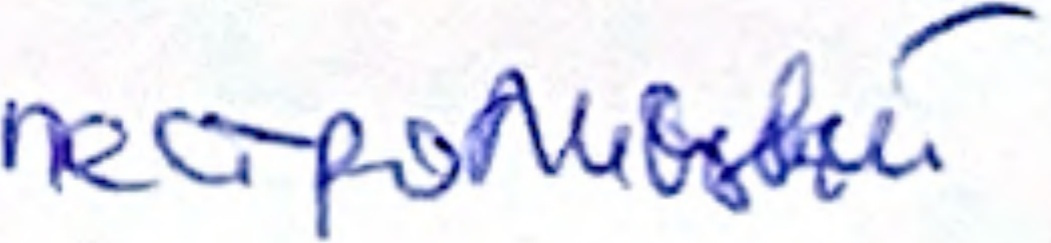пестролицый
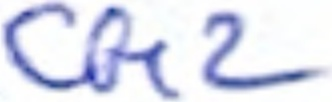сыч
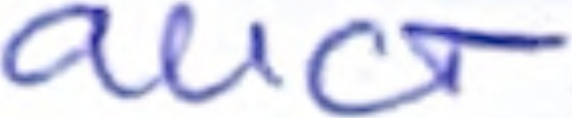аист
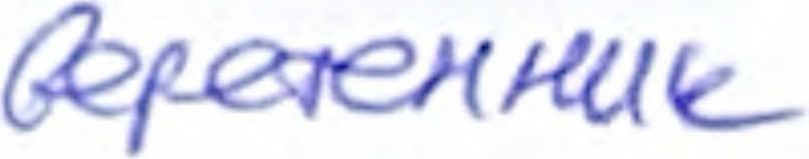веретенник
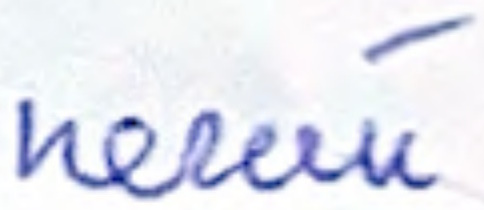пегий
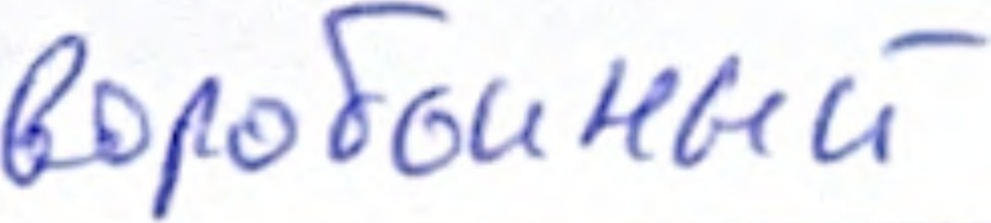воробьиный
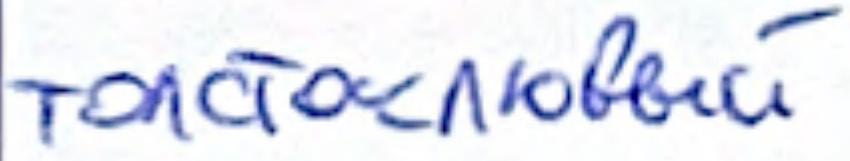толстоклювый
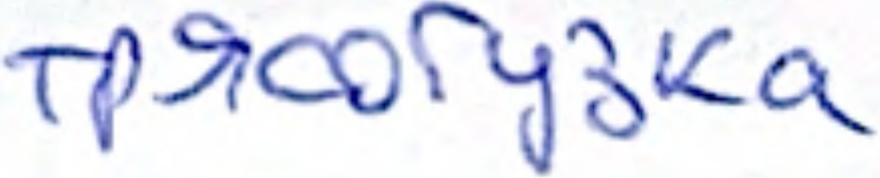трясогузка
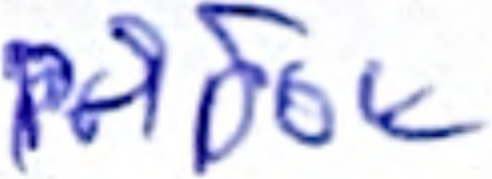рябок
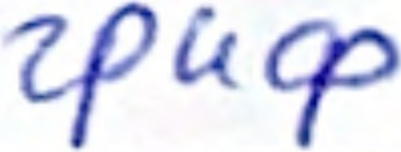гриф
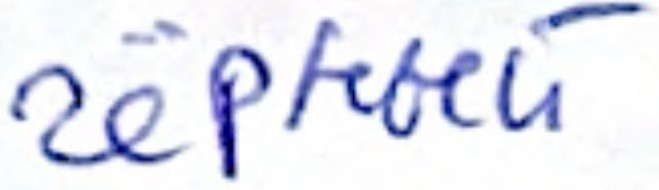чёрный
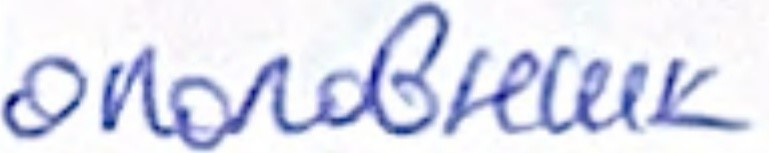ополовник
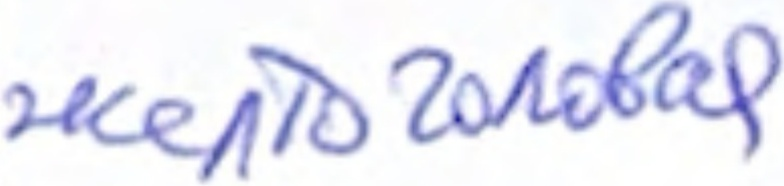желто головая
